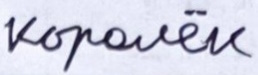королёк
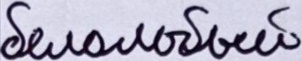белолыбыйы
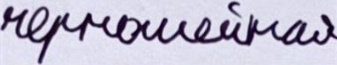черношейная
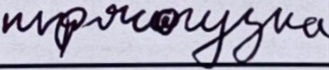трясогузка
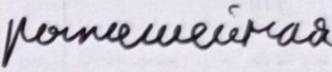рыжешейная
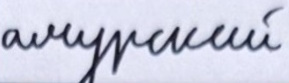амурский
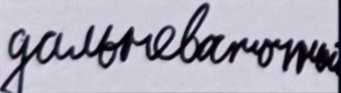дальневаточный
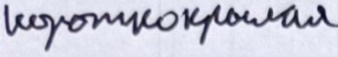короткокрылая
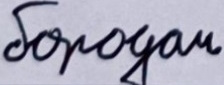бородач
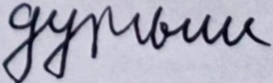дутыш
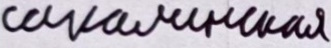сахалинская
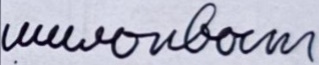шилохвост
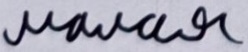малая
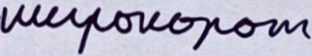широкорот
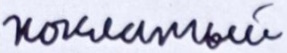хохлатый
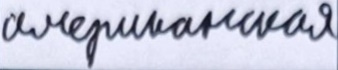американская
